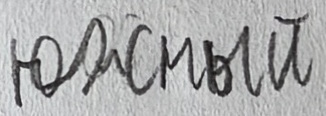южный
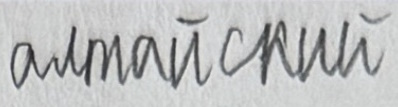алтайский
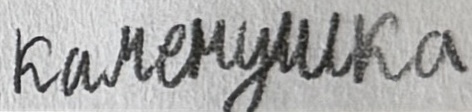каменушка
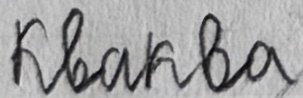кваква
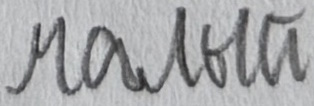малый
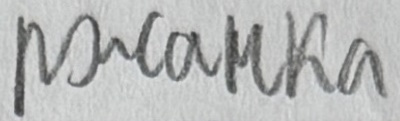ржанка
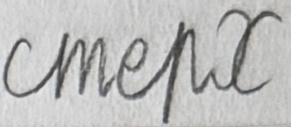стерх
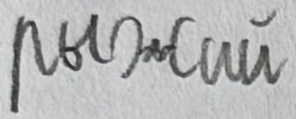рыжий
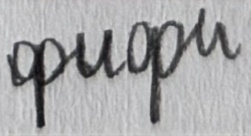фифи
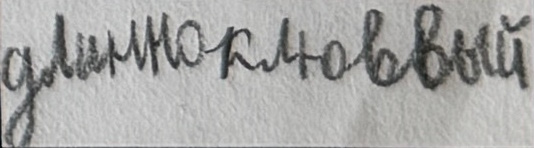длинноклюввый
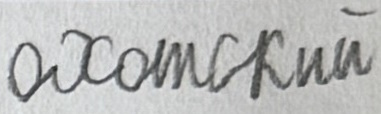охотский
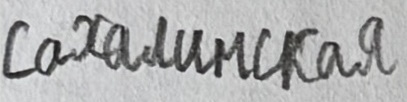сахалинская
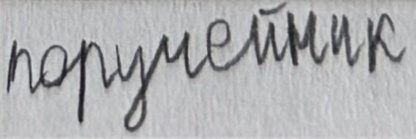поручейник
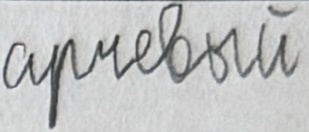арчевый
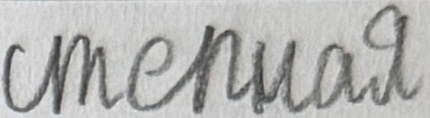степная
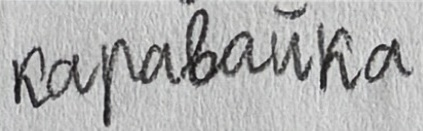каравайка
